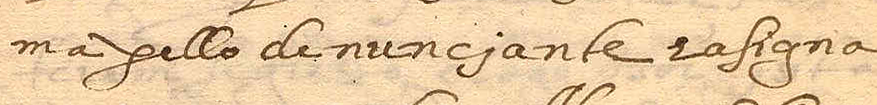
ma pello denuncjante E asigna
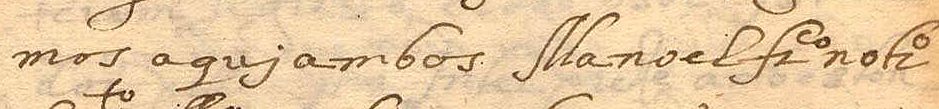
mos aquj ambos Manoel frco notro
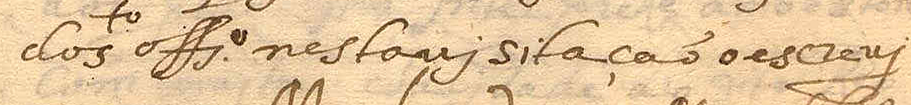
do sto offj.o nesta ujsitaçaõ o escreuj
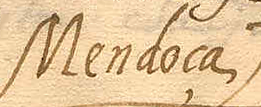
Mendoça
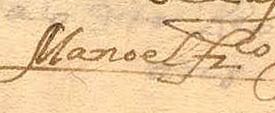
Manoel frco
